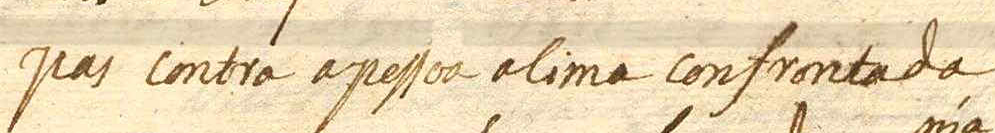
pas contra a pessoa acima confrontada
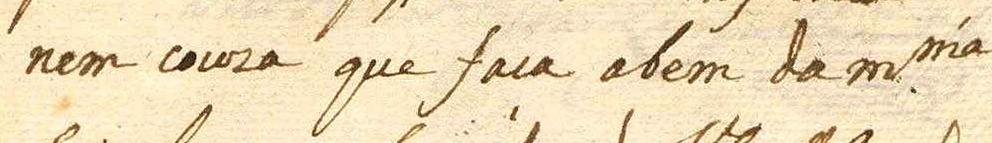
nem couza que faça a bem da m.ma
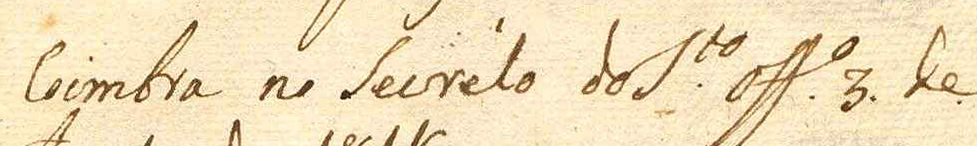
Coimbra no Secreto do S.to off.o 3. de
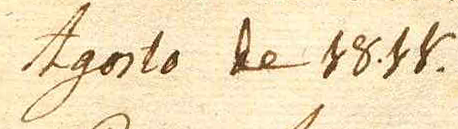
Agosto de 1811.
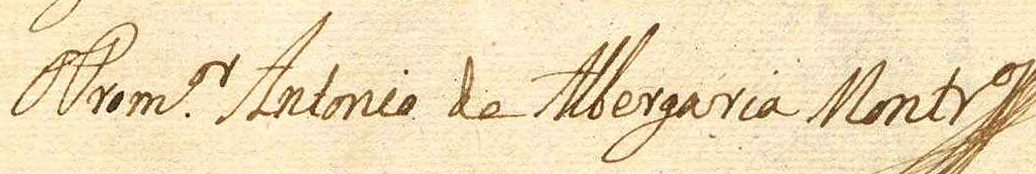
O Prom.or Antonio de Albergaria Montr.o
